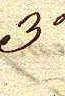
3o
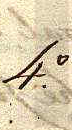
4.o
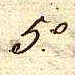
5.o
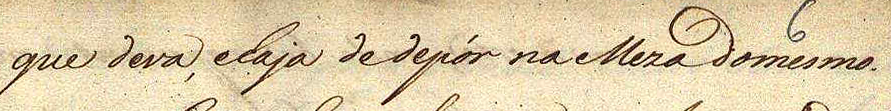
que deva, e haja de depór na Meza do mesmo.
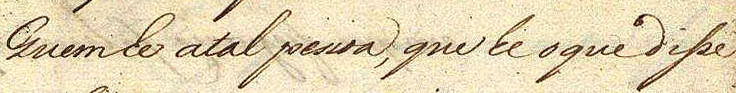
Quem he a tal pessoa, que he o que disse
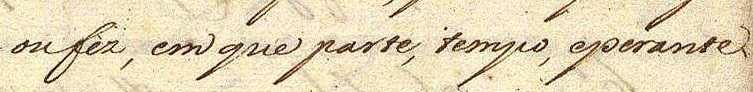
ou fez, em que parte, tempo, e perante
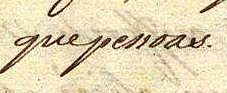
que pessoas.
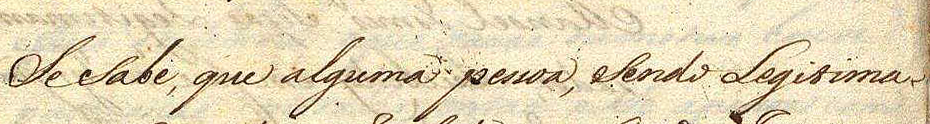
Se Sabe, que alguma pessoa, Sendo Legitima
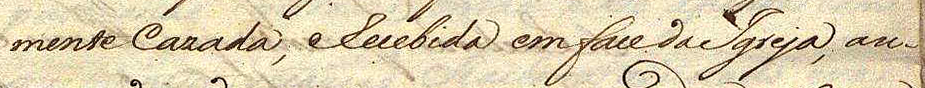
mente cazada, e Recebida em face da Igreja au
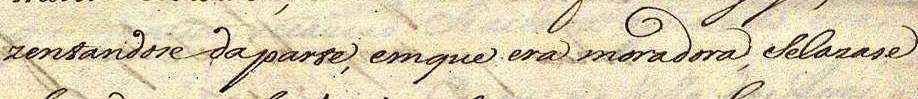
zentandose da parte, em que era moradora Se Cazase
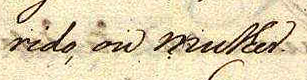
rido, ou mulher
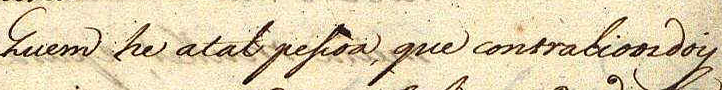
Quem he a tal pessoa, que contrahio os dois
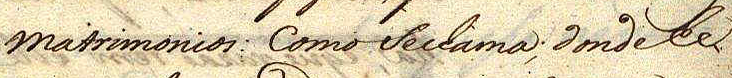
matrimonios: como se chama; donde He
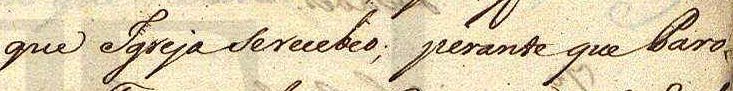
que Igreja se recebeo; perante que Paro
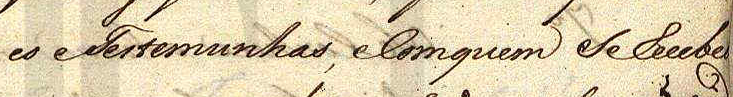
co e testemunhas, e Com quem se Recebeo
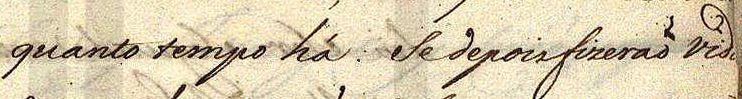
quanto tempo há: Se depois fizeraõ vid
